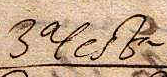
3a testa
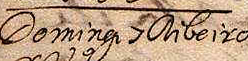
Domingos Ribeiro
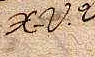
X - V.o
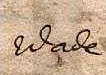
idade
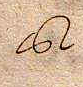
R
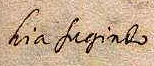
hia fugindo
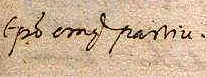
tpō em q̄ partiu.
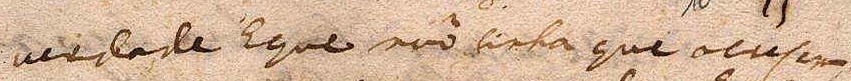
uerdade E que naõ tinha que acresem
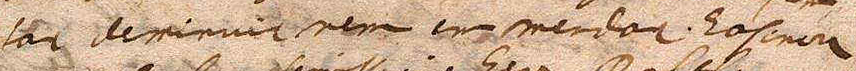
tar deminuir nem emmendar. E asinou
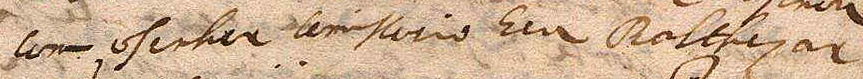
com o senhor comissario E eu Balthezar
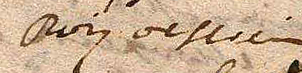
Roīz o escre
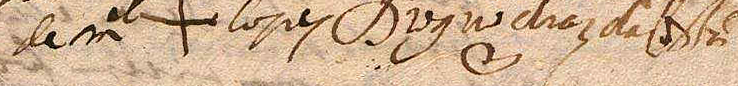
de mel + lopes Dioguo diaz da Costa
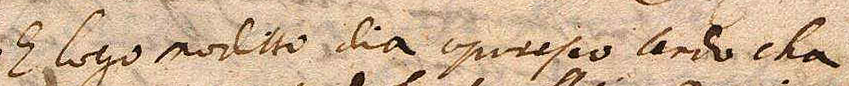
E logo no ditto dia apareseo sendo cha
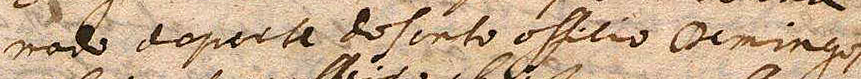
mado da parte do santo officio Domingos
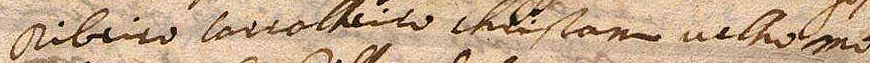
Ribeiro carralheiro christam uelho mo
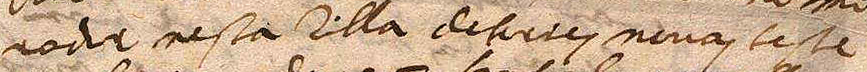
rador nesta villa de torres nouas teste
